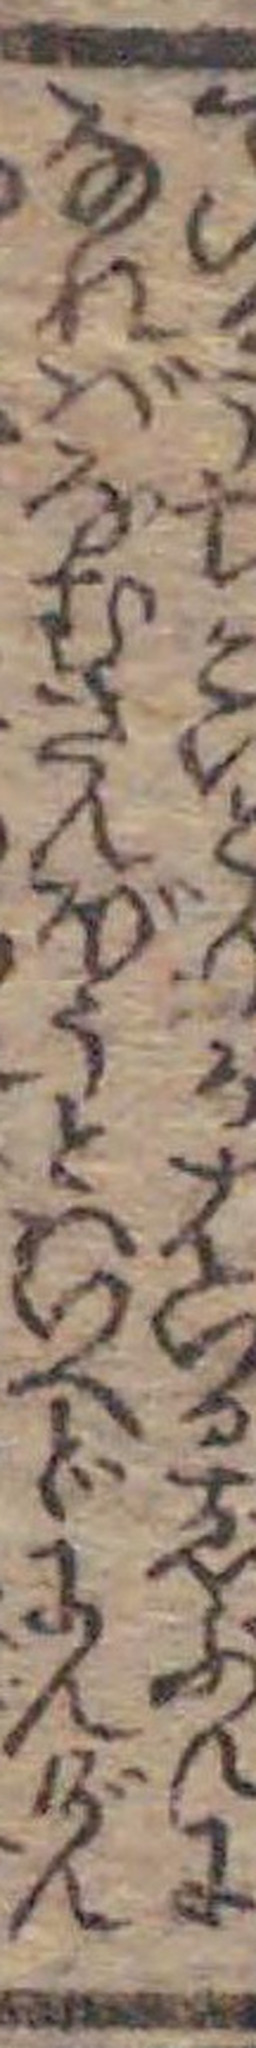なればなむさんぼうといへどにんげん
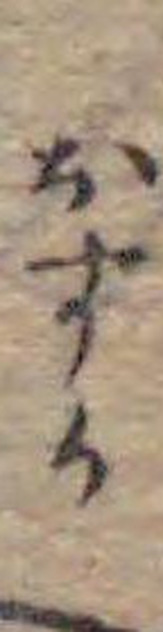おすか
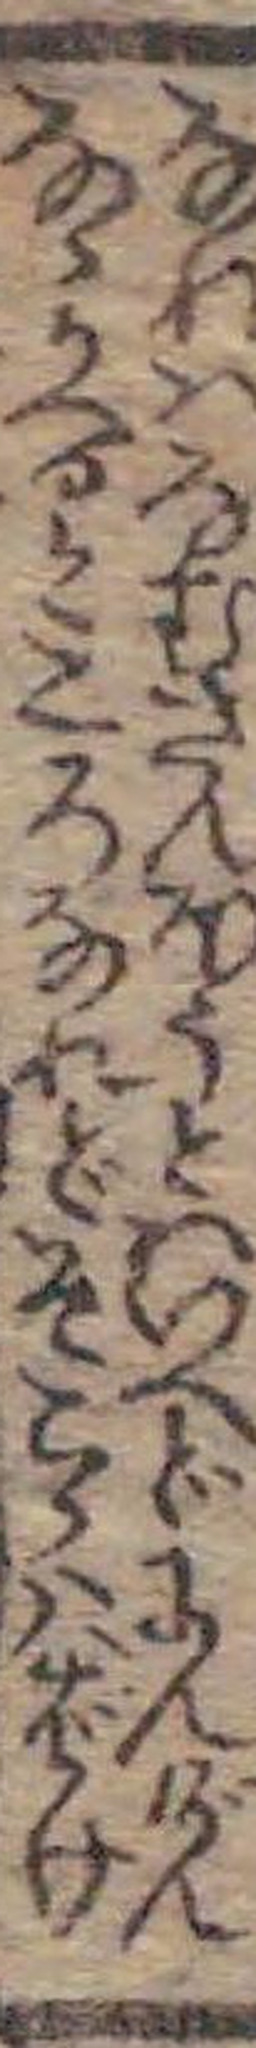ならかへるところなれどそこらはばけ
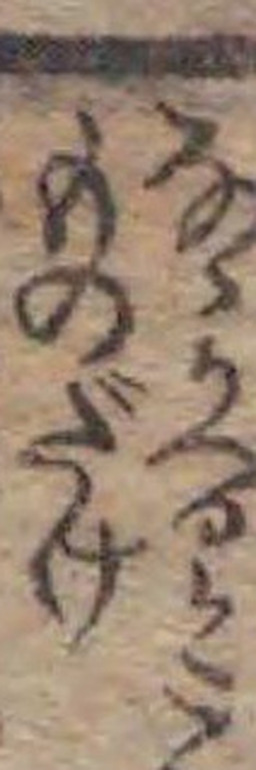ものだけ
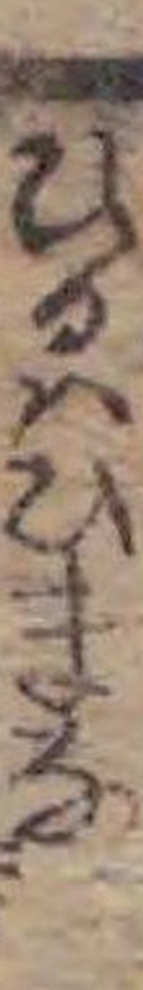ひるはひまな
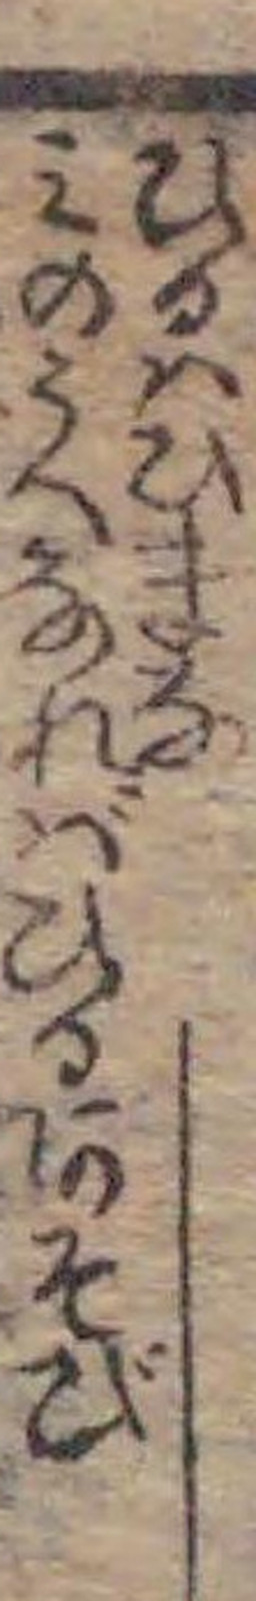みのうへなればひるあそび
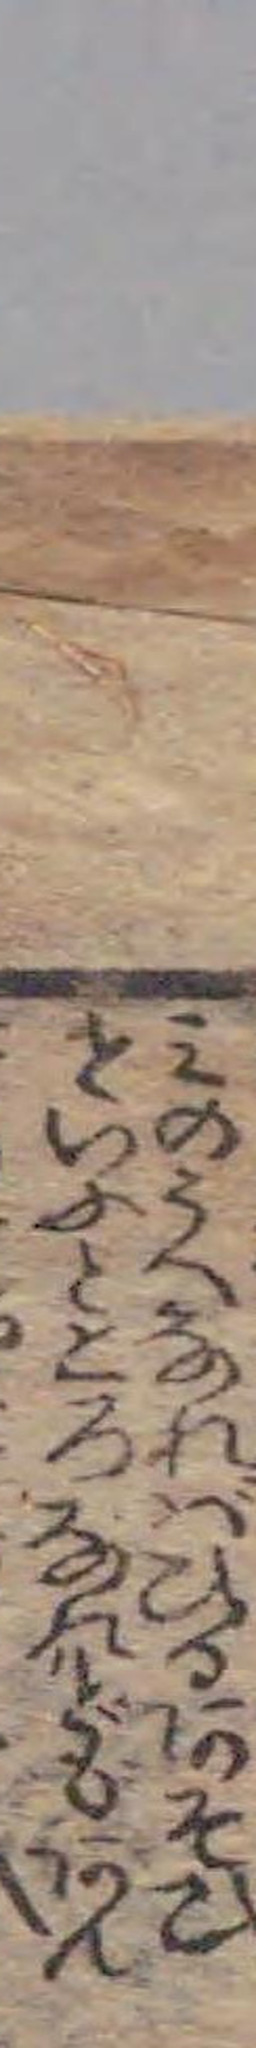といふところなれどもあん
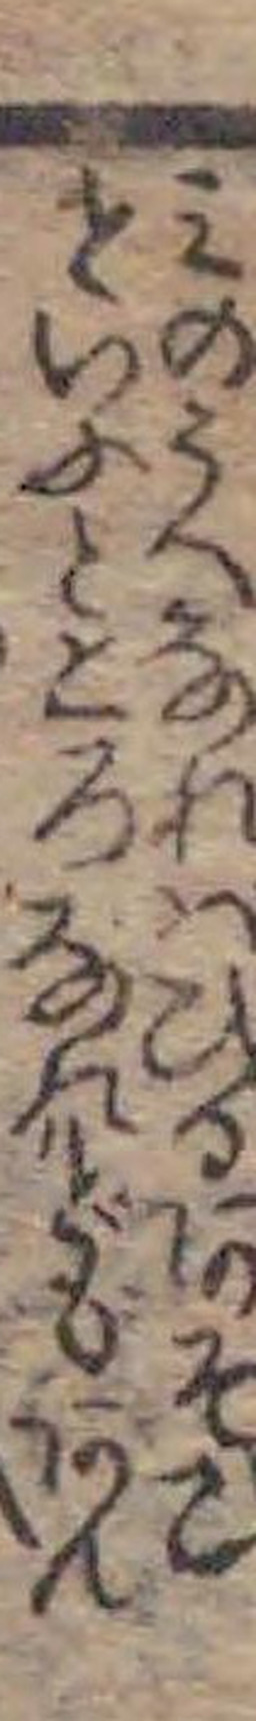といふところなれどもあん
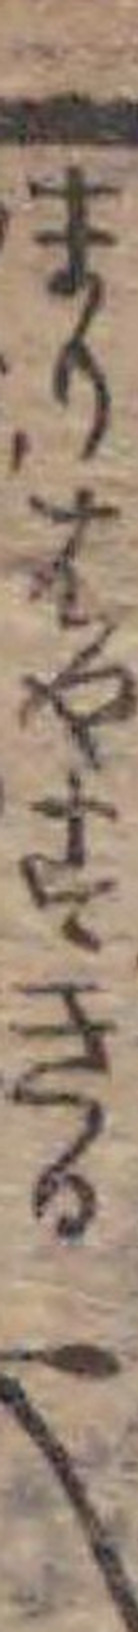まりはやすきる
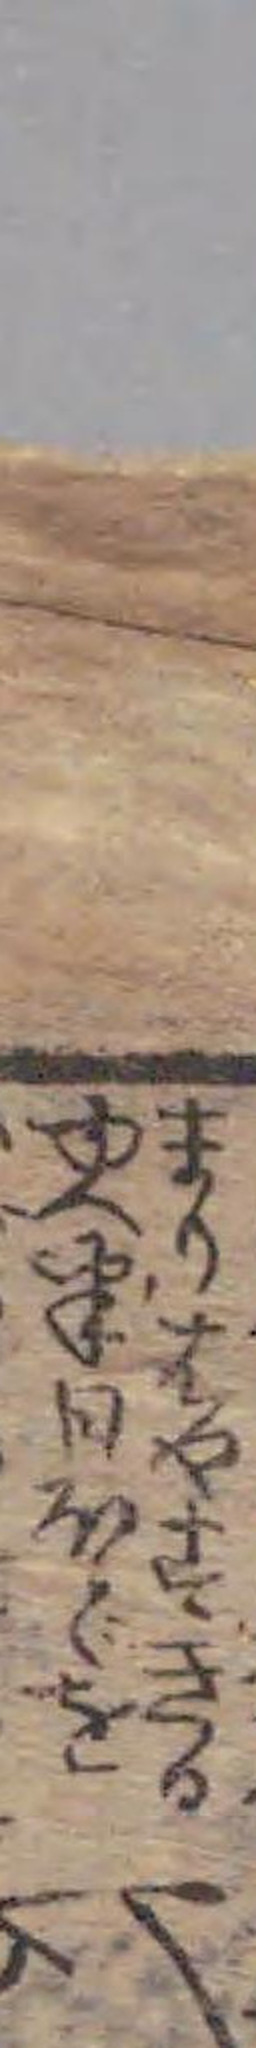ゆへ半日ほどを
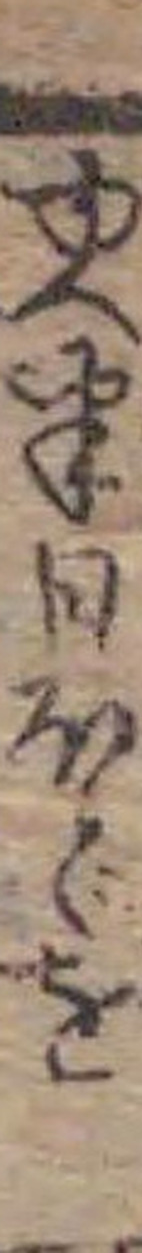ゆへ半日ほどを
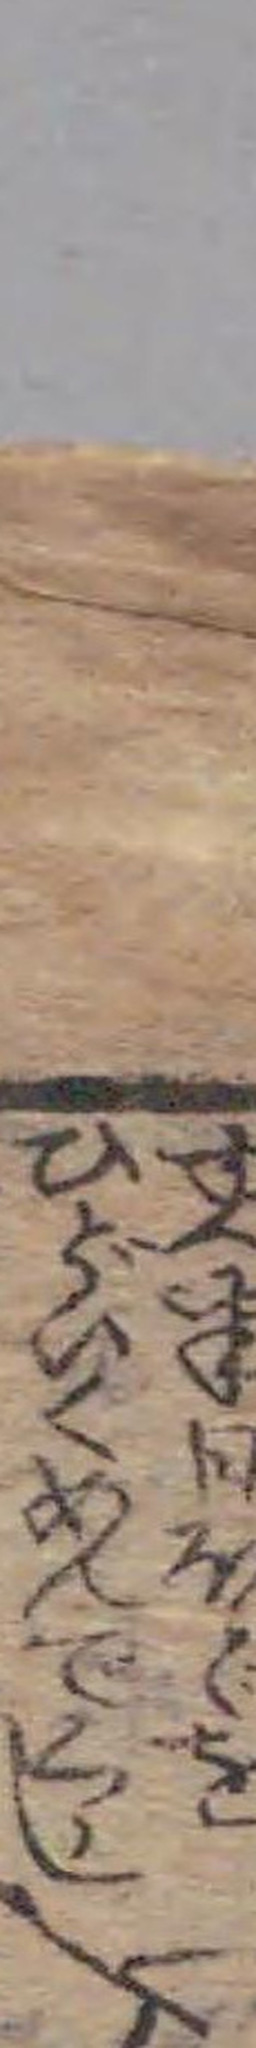ひどいくめんでくらし
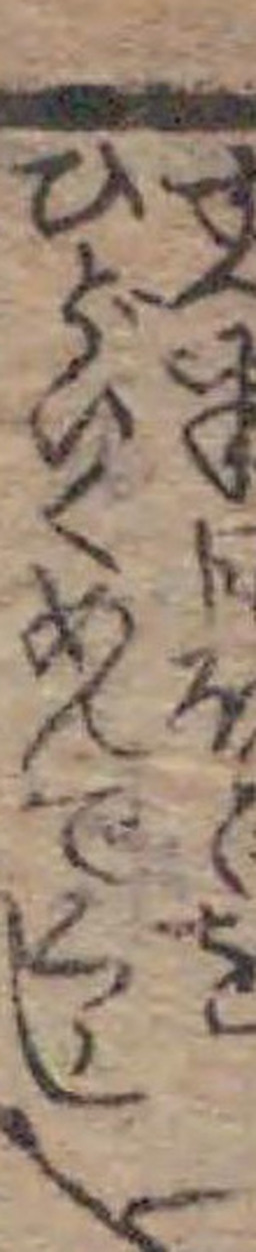ひどいくめんでくらし
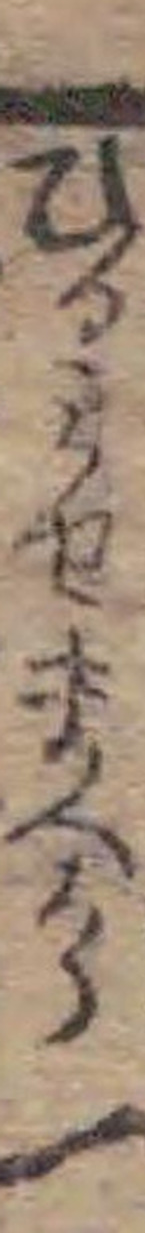ひるみせまへから
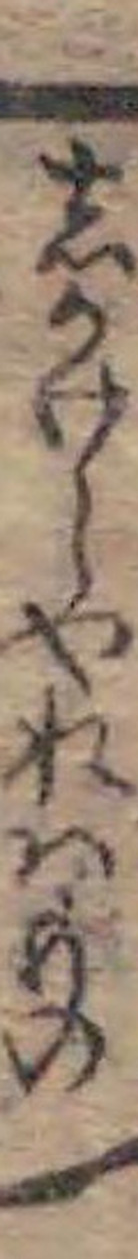しかけしやねはもの
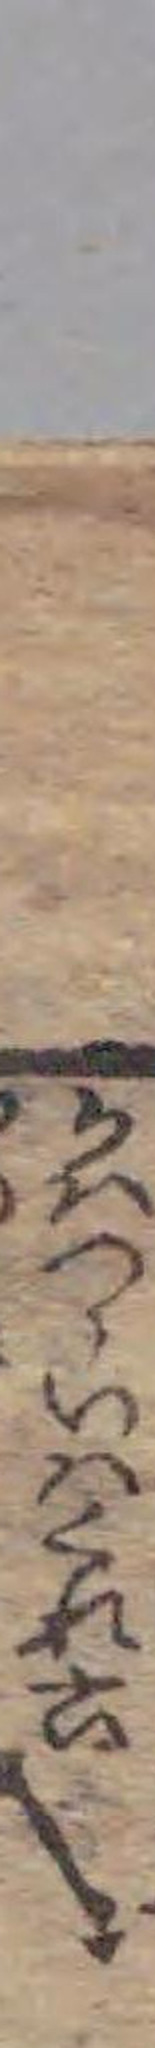かはつらいはくれ六
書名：化物楽屋異牒 : 2巻
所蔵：国立国会図書館 National Diet Library, JAPAN
